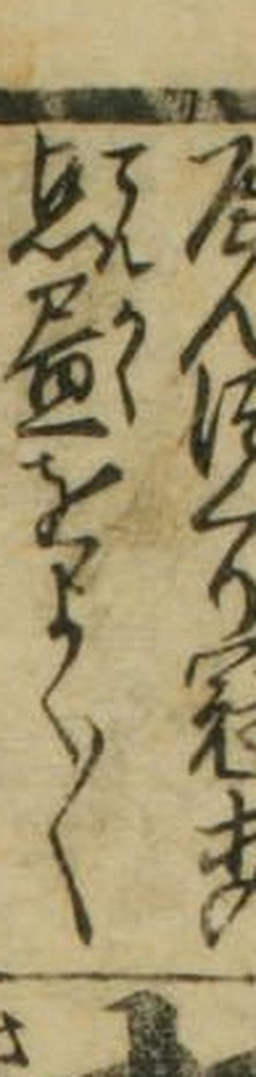点畫をよく〳〵
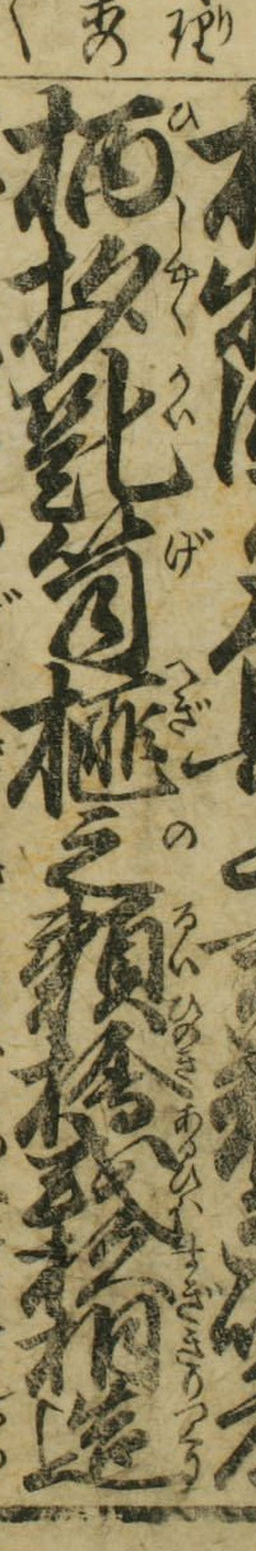柄杓匙笥櫃之類檜或杦桐造
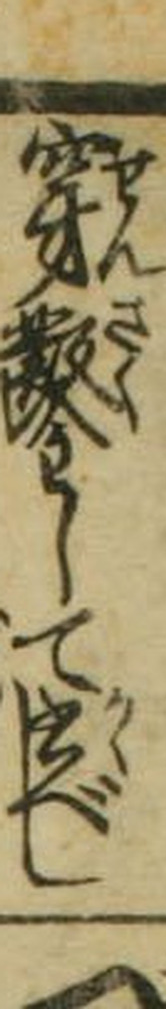穿鑿して書べし
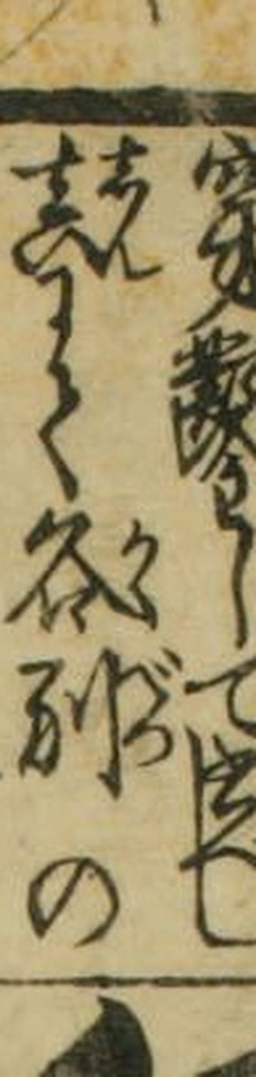真にて各別の
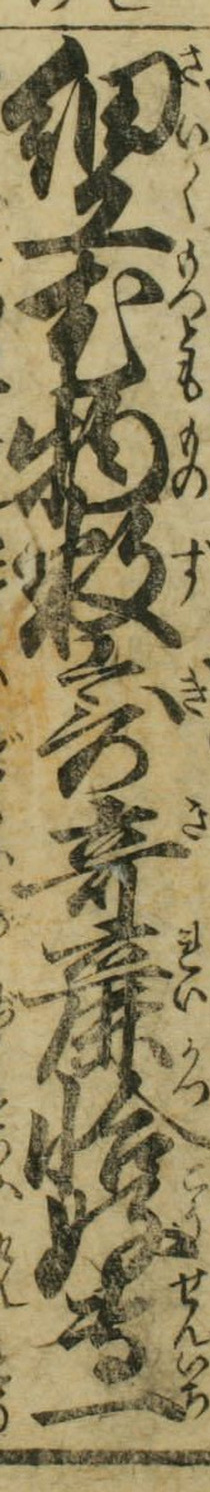細工尤物数寄奇麗恰好専一
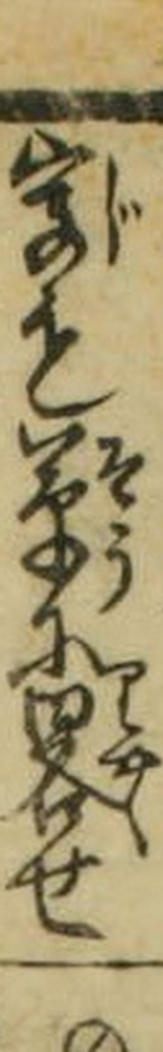字を草に畧せ
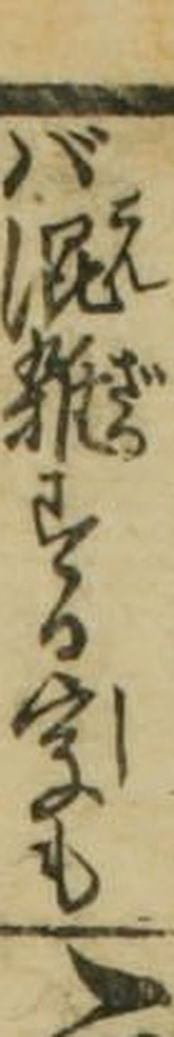ば混雑する字も
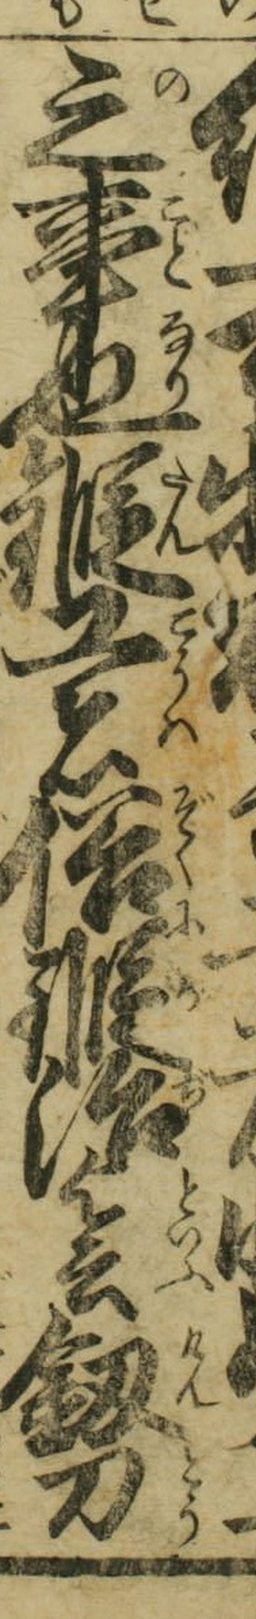之事也鍛工者俗鍛冶与云釼刀
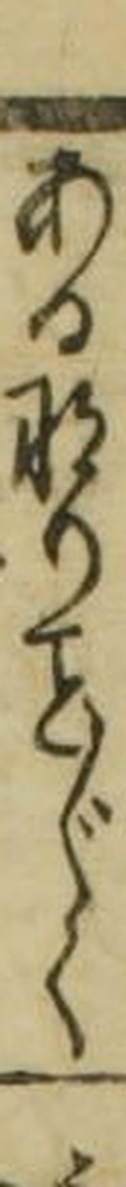あるなりこと〴〵く
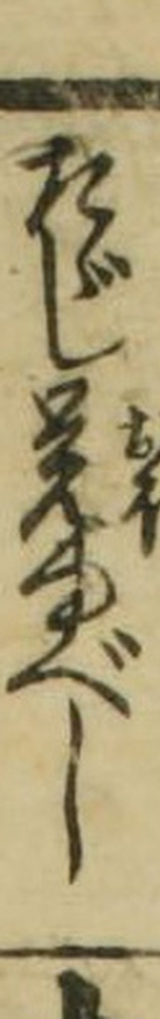たゞし覚ゆべし
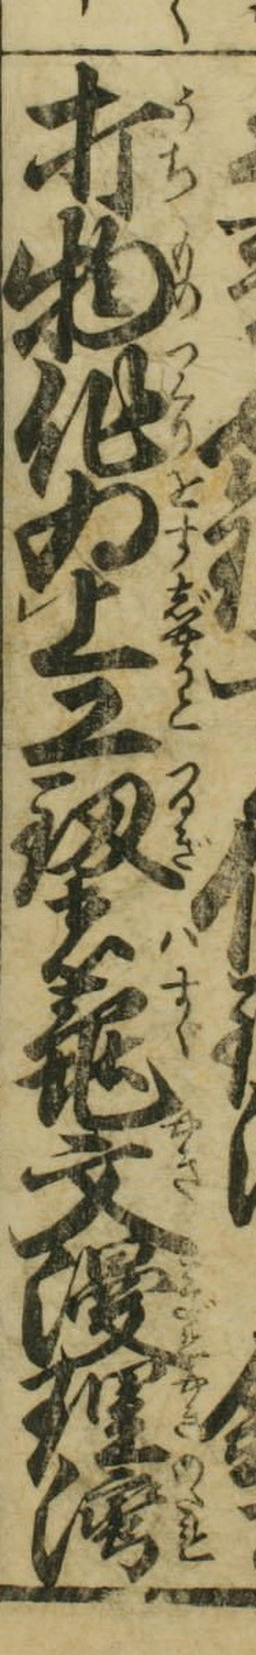打物作為上工釼者亀文漫理湾
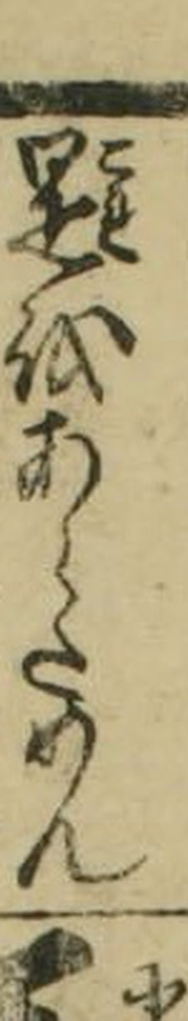是をあらためん
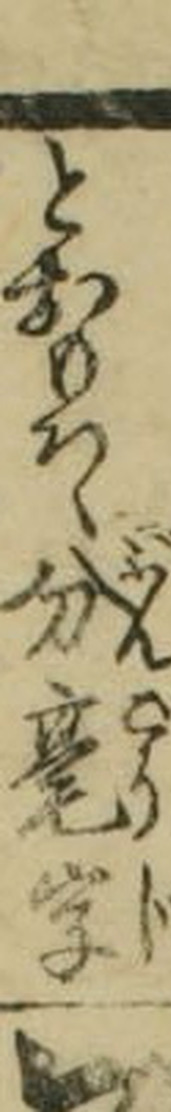とおもはゝ分毫字
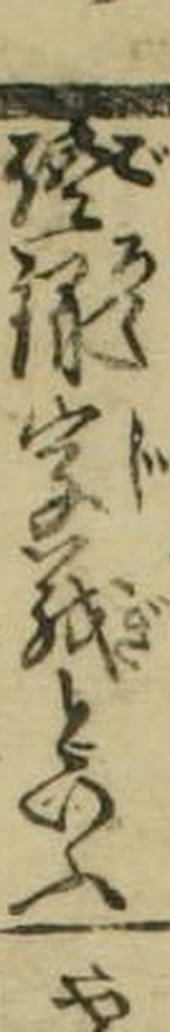語録字義といふ
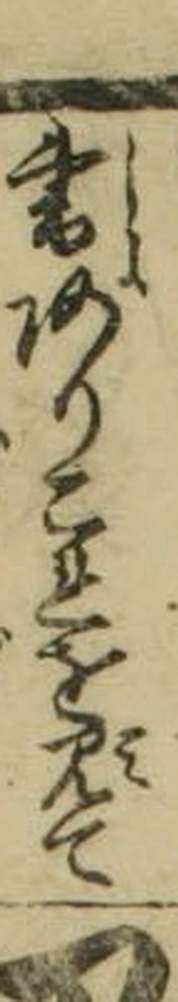書ありこれを見て
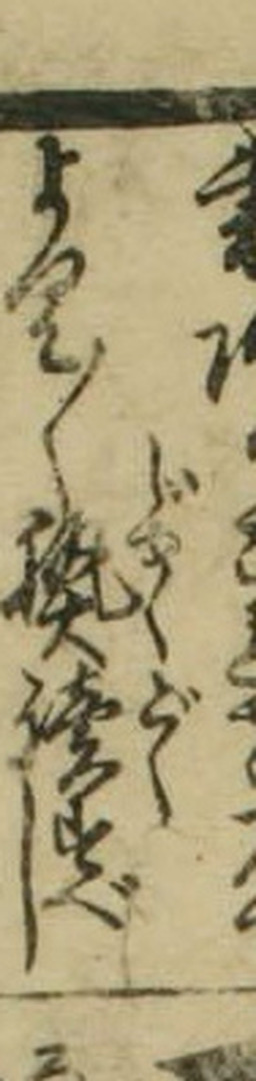よく〳〵熟讀すべし
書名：増補職人往来
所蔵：東京学芸大学教育コンテンツアーカイブ
